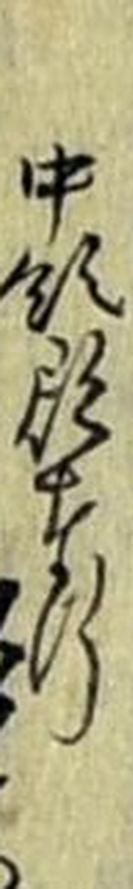上領郡奉行
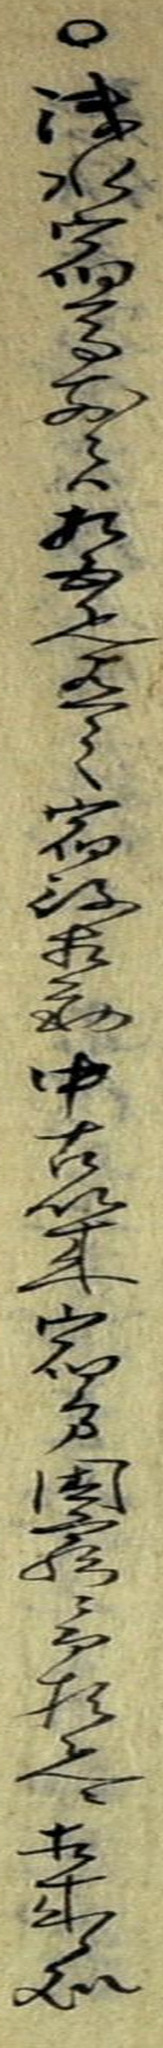〇浅水宿馬前々ハ拾五疋有之宿役相勤中古以来宿方困窮ニ而拾疋ニ相来候処

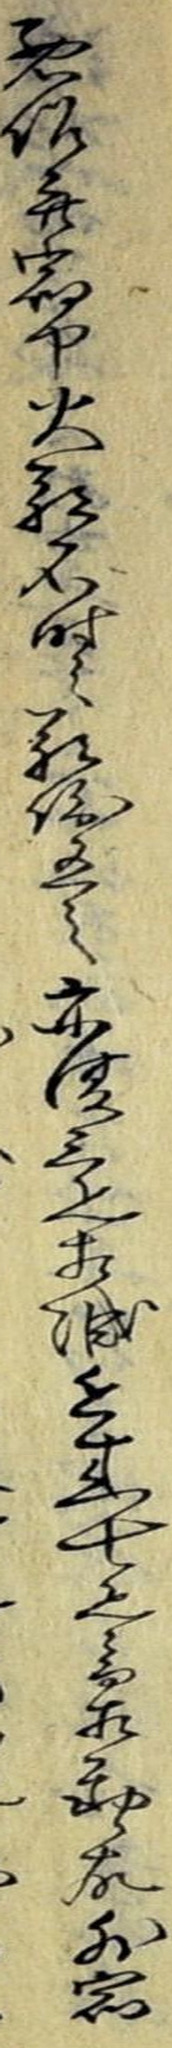悪作并宿中火難不時之難儀有之亦復三疋相減近来七疋ニ而相勤候故外宿
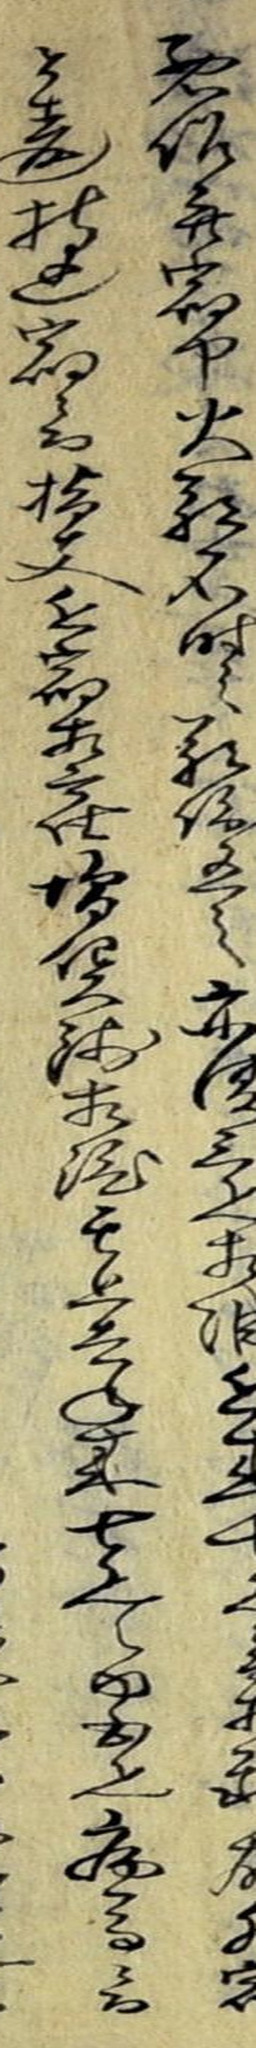と違持込宿ニ而指支近宿相雇増賃銭相渡其上去年来七疋之内五疋病馬ニ而
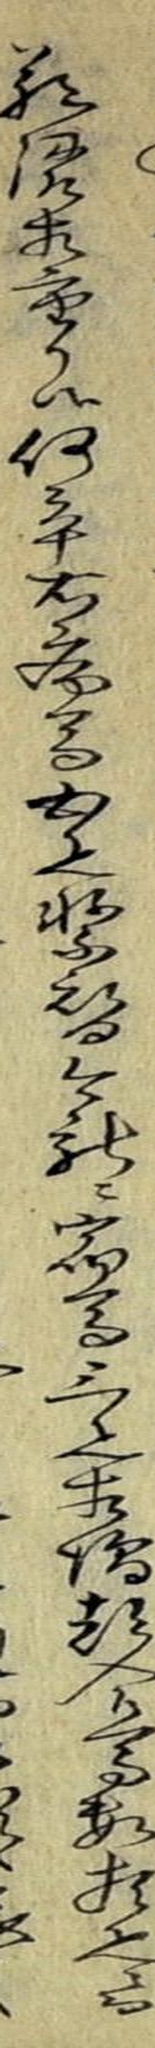難渋相重り候何卒右病馬五疋繋替今新ニ宿馬三疋相増都合馬数拾疋ニ而
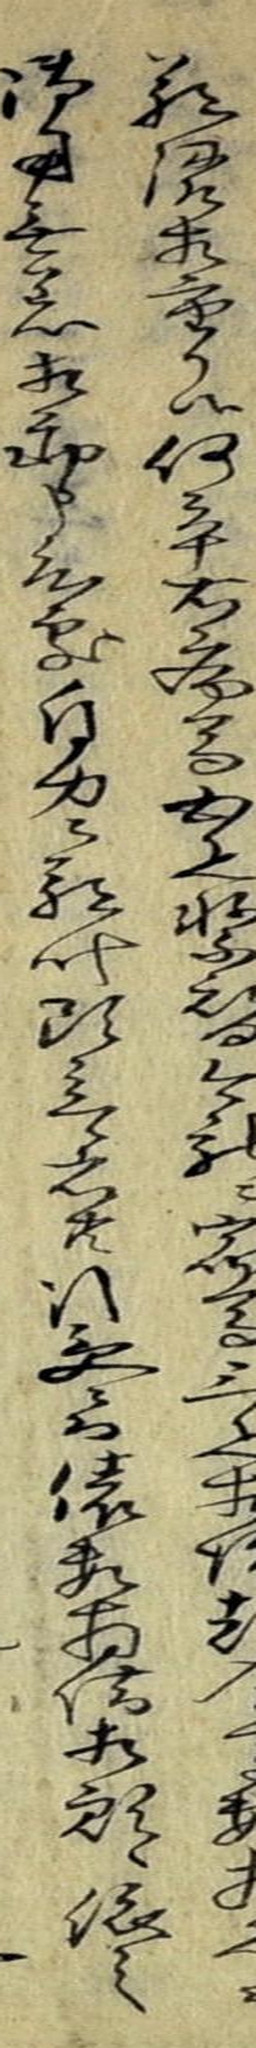御用無恙相勤申度処自力ニ難叶頭立候者共引受ニ而俵数拝借相願候依之
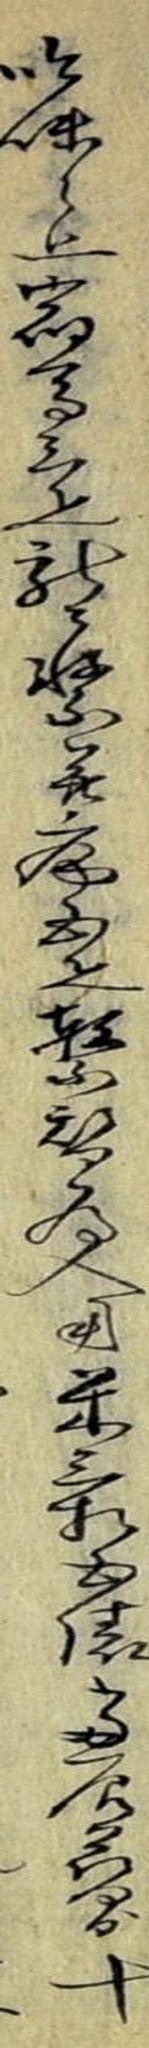吟味之上宿馬三疋新ニ繋并病五疋繋替為入用米三拾五俵当辰暮ゟ十
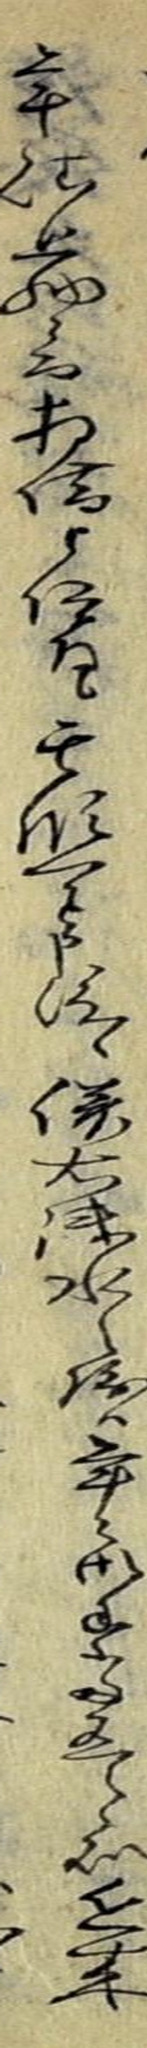年賦上納ニ而拝借被仰付候其段可被申渡候弊併右浅水之儀ハ年々御手当有之処近来
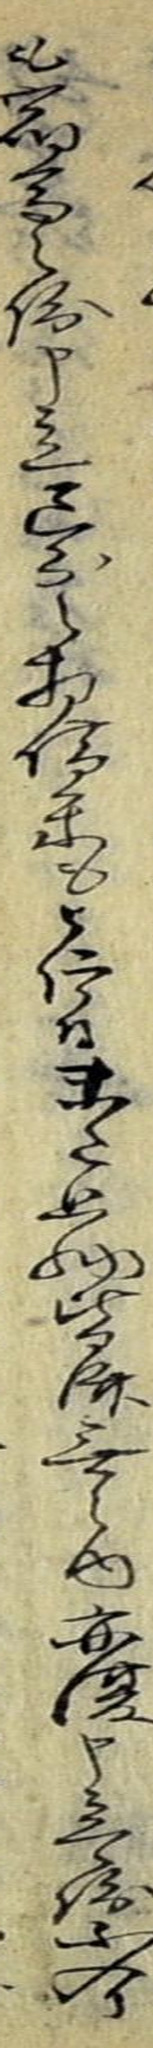も宿馬之儀申立過分之拝借米も被仰付未た上納皆済無之内亦復申立候儀不〆り
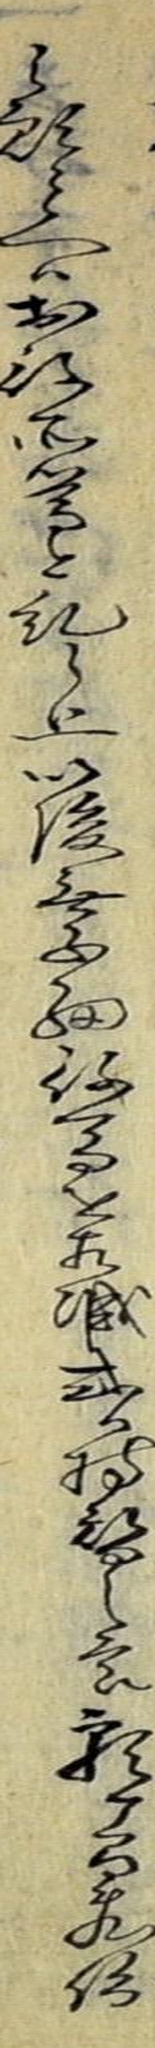之願ニ候へハ於役所篤と糺候上以後無子細役馬を相減或ハ持替之節願ケ間敷儀
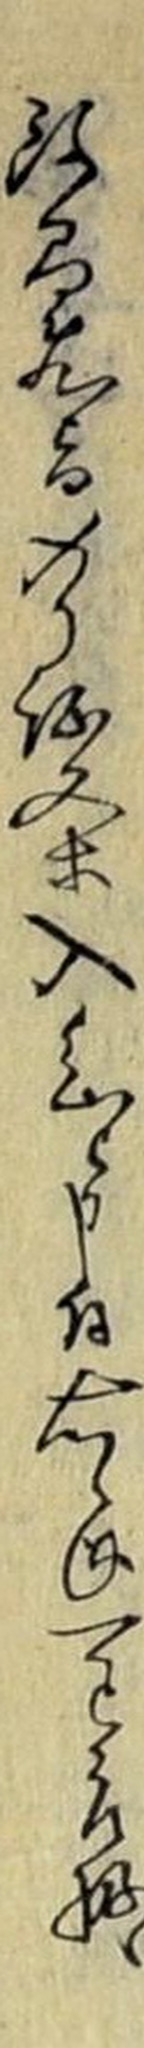致間敷旨〆り証文等入念被申付右之趣可被取扱候
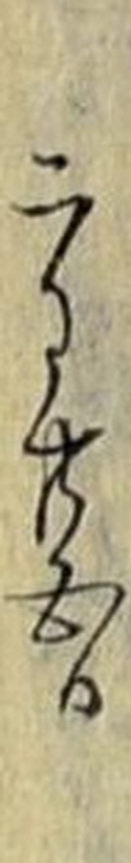二月廿五日
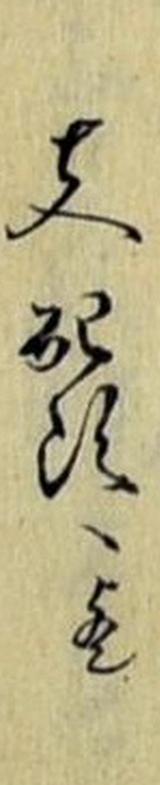支配頭へ歟
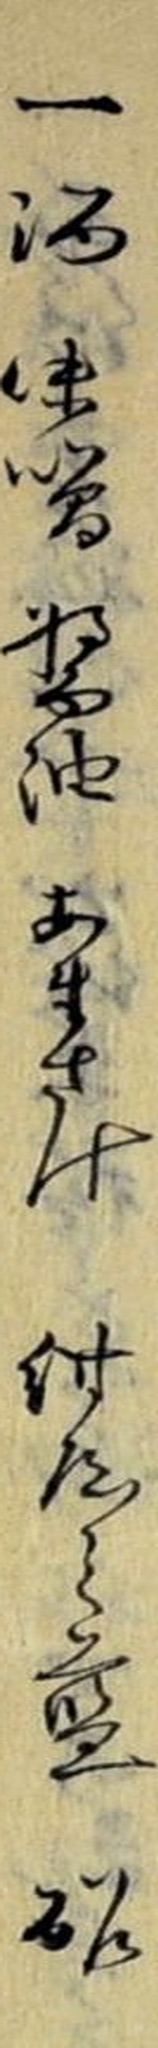一酒味噌醤油あまさけ紺屋之藍酢
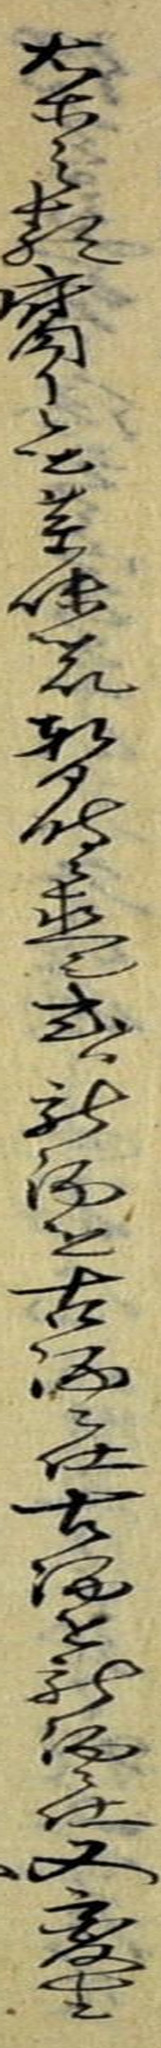右等之類腐り候を薬味を以暫時ニ直シ或ハ新酒を古酒ニ仕古酒を新酒ニ仕又変生
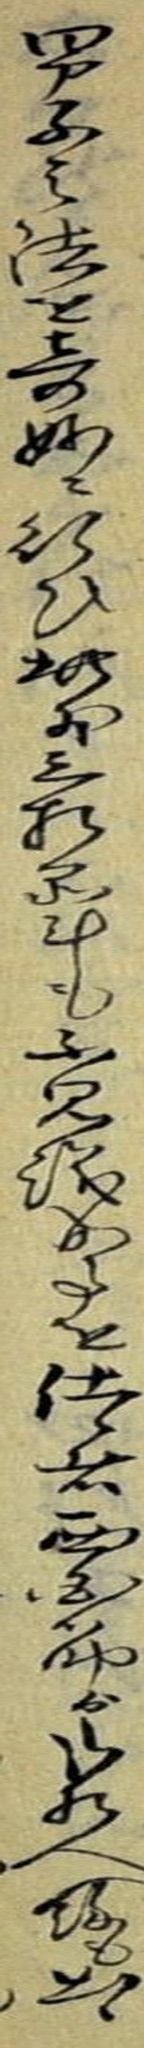男子之法を奇妙ニ行ひ此外三拾品斗も不思議成事を仕候者西国筋ゟ弐拾人余も出候
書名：命令之部 三
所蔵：福井県文書館 Fukui Prefectural Archives
